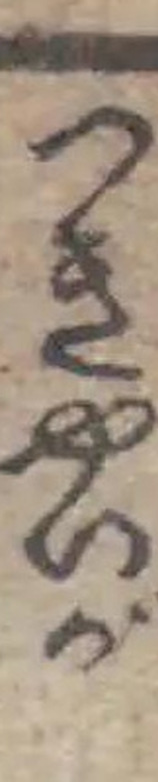つきやいが
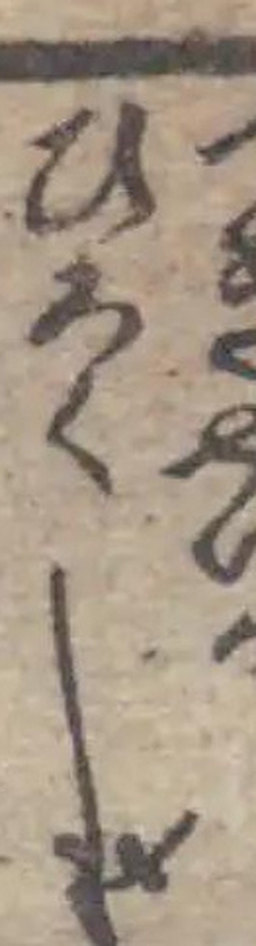ひろく
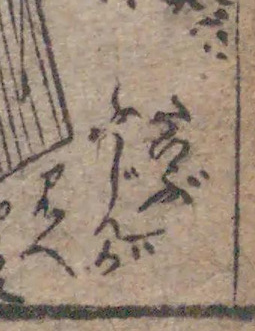たいぶ
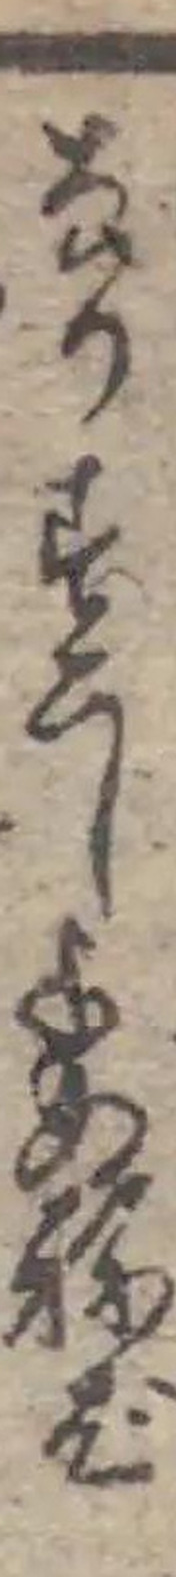なりすこしよめねば
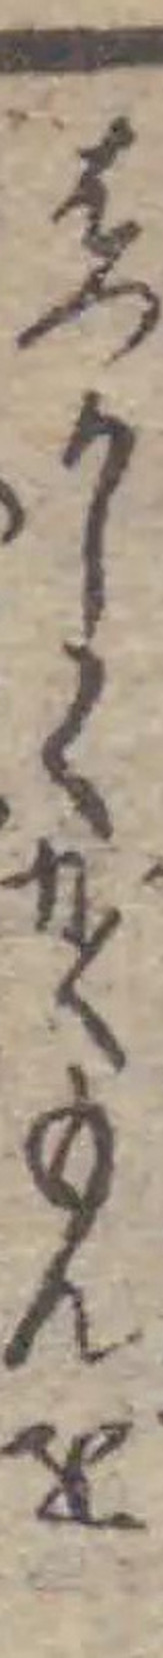はつかしくかくもんを
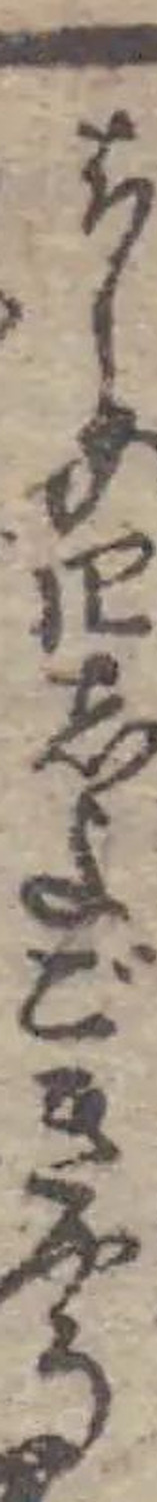はしめ四しよごきやう
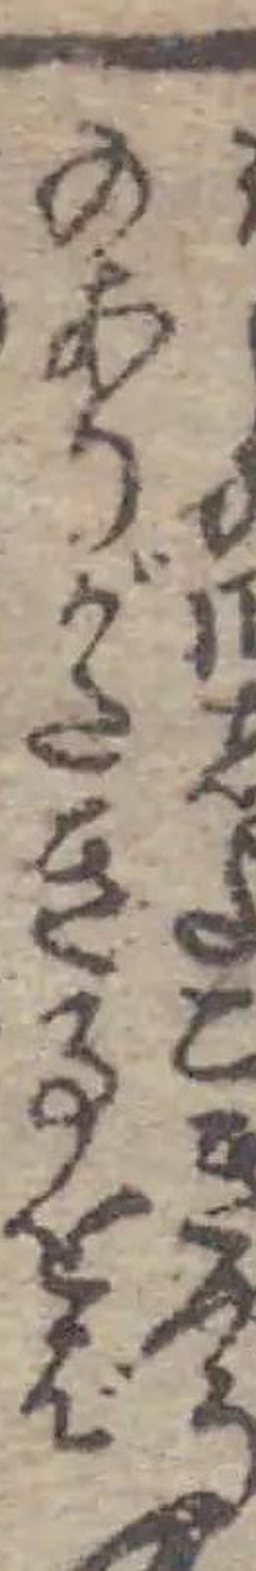のありがたき事をば
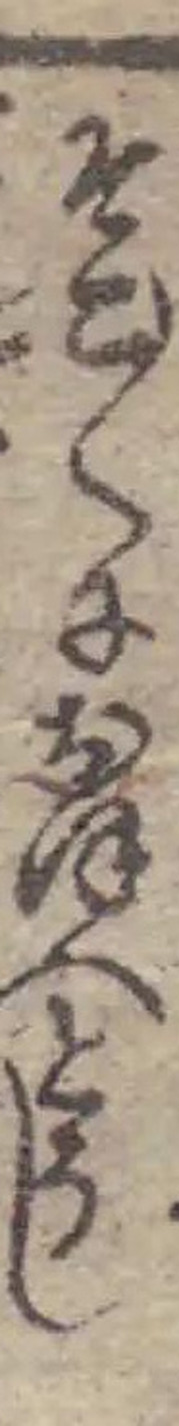そこ〳〵におほへとうし
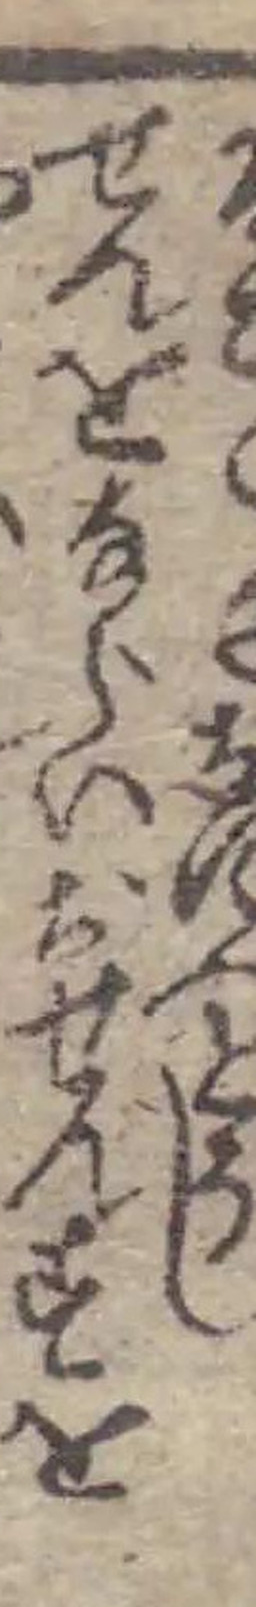せんをならいおせんすを
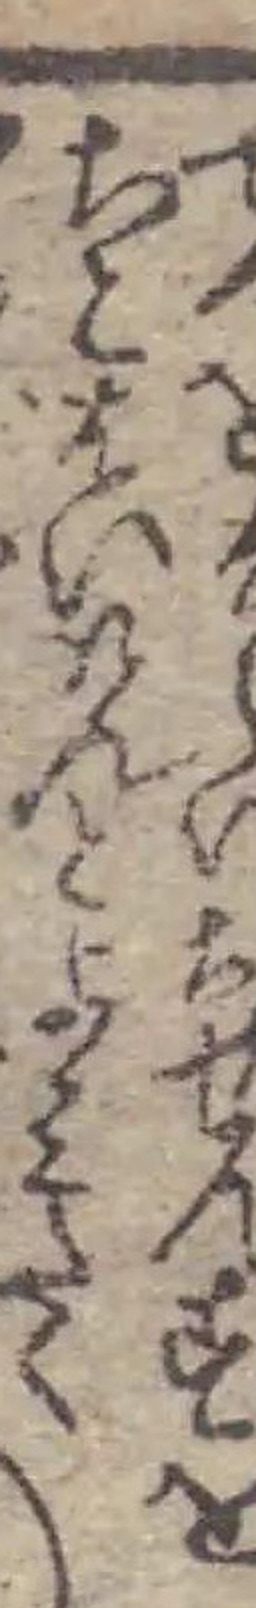ちとはいけんとよみたゝ
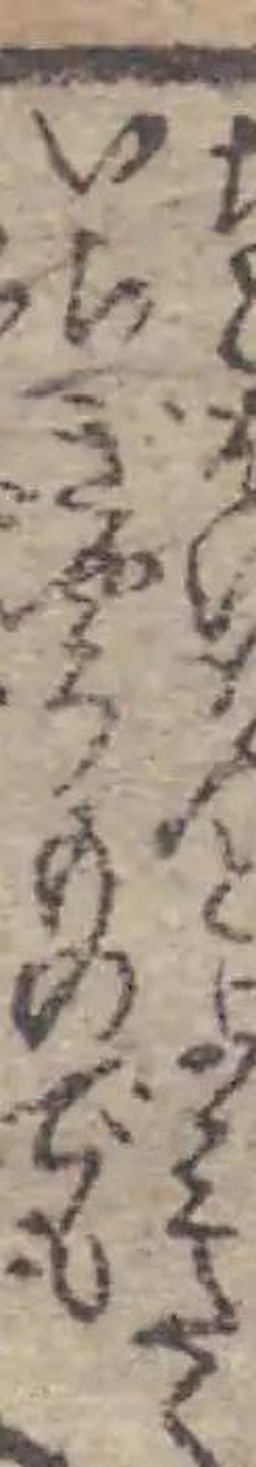いちぎやうものでも
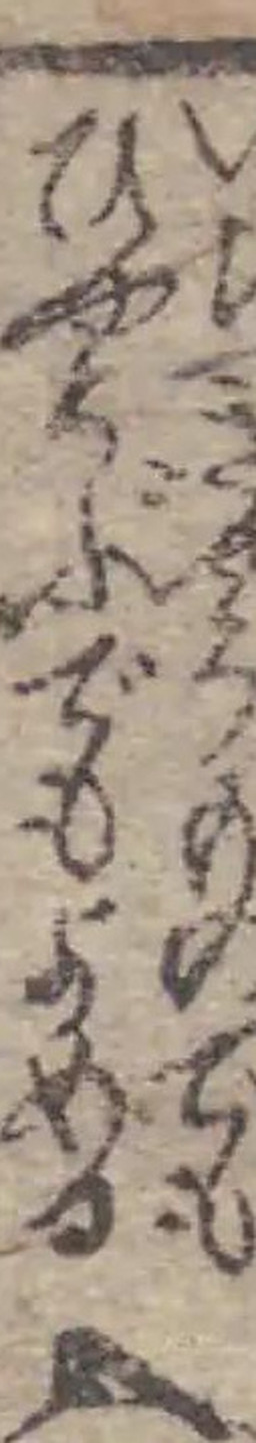ひやうぶでもよめる
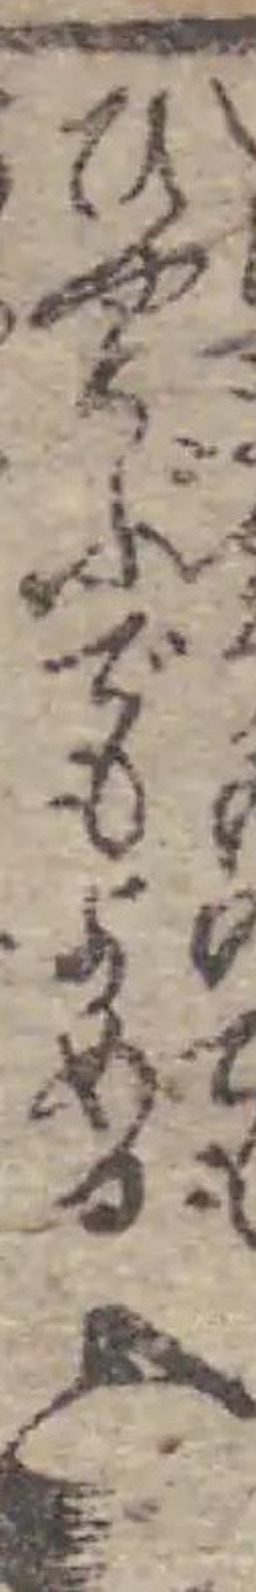ひやうぶでもよめる
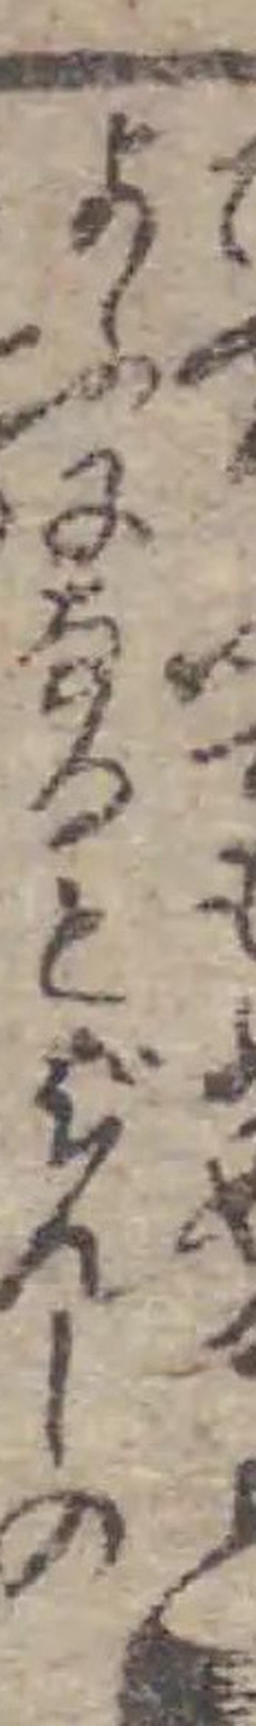よふになるとばんしの
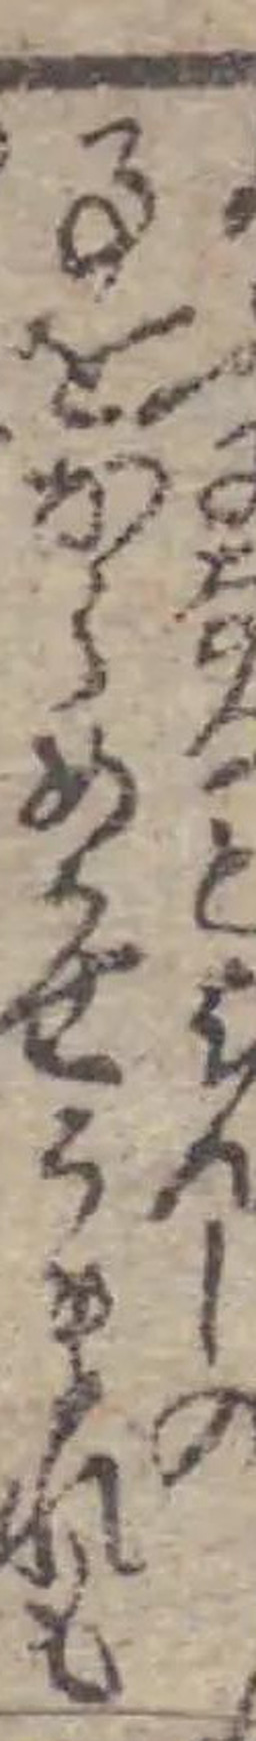事をからめかせうまれも
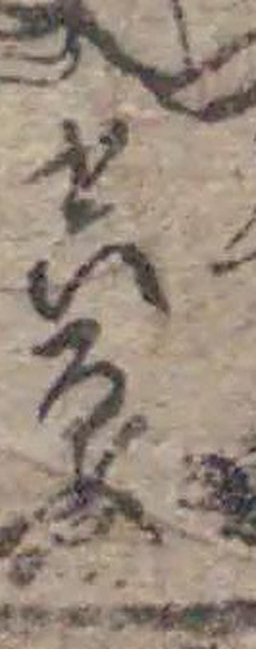せいろふ
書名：津以曽無弟の甚六 3巻
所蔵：国立国会図書館 National Diet Library, JAPAN
